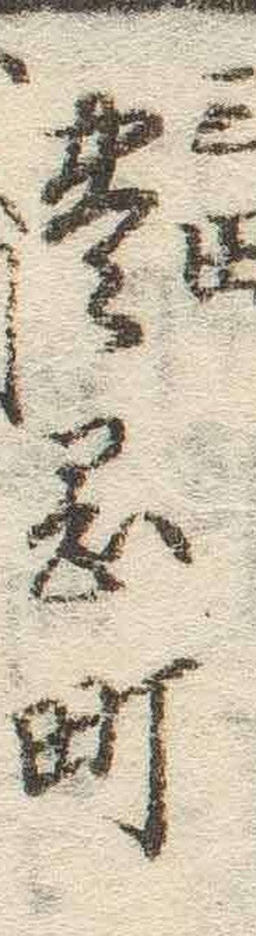豊岡町
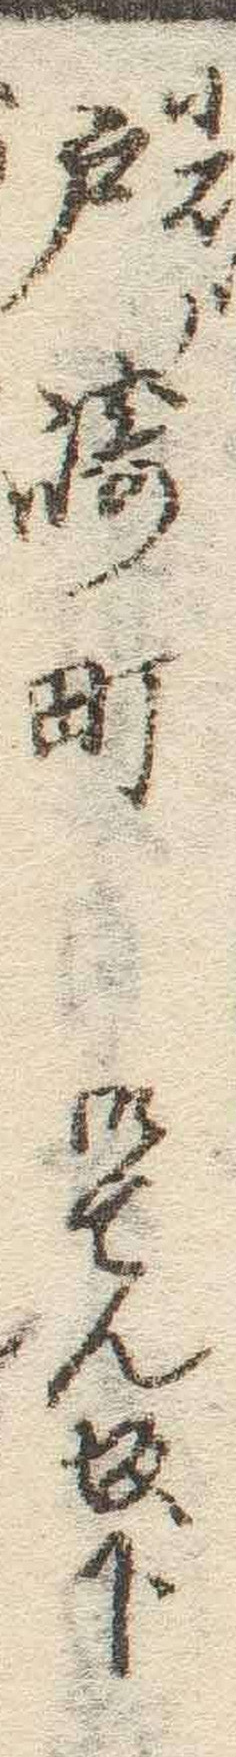戸崎町御てん坂下
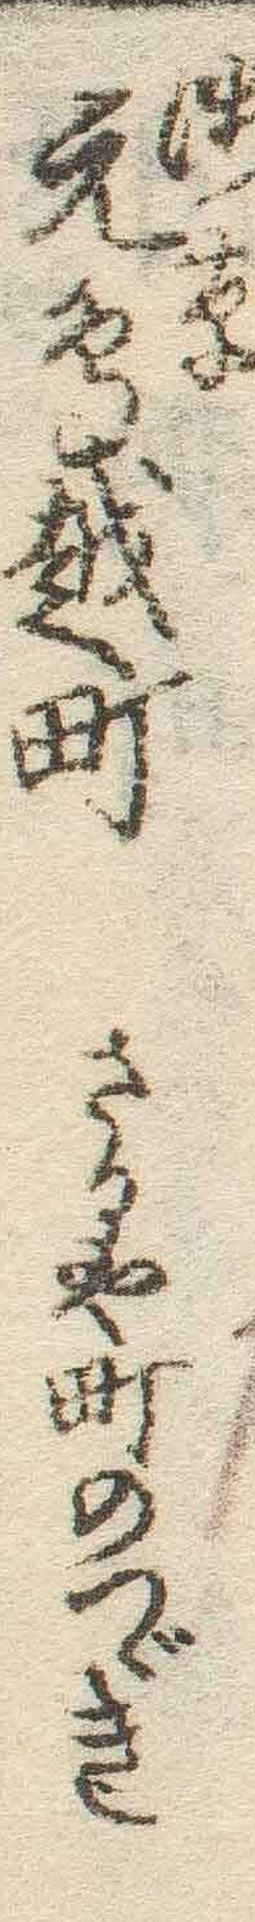元鳥越町さるや町のつゞき
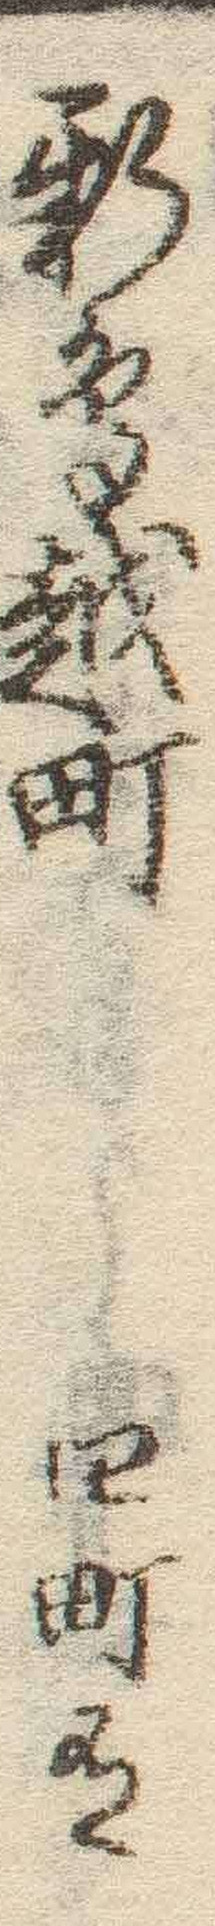新鳥越町四町有
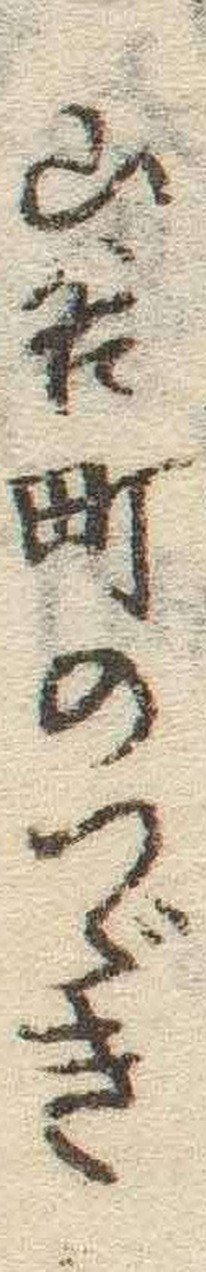山谷町のつゞき
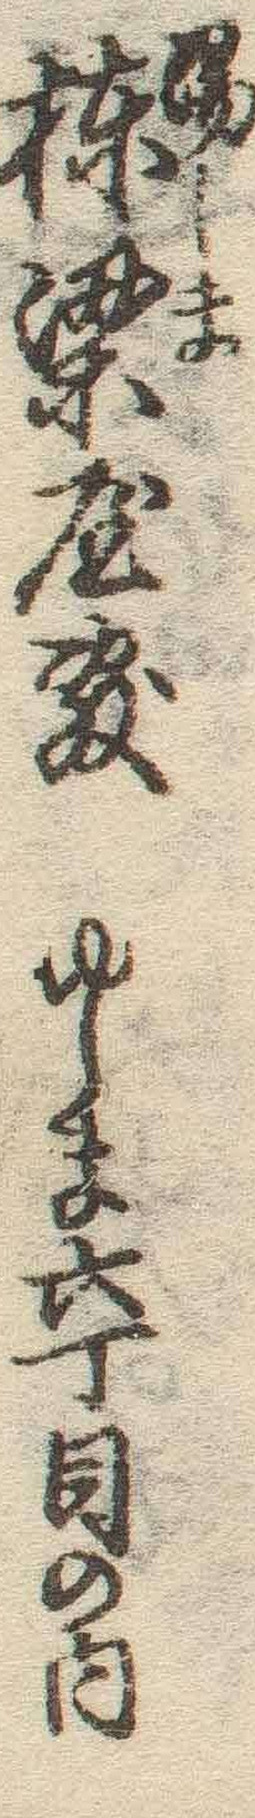棟梁屋敷ゆしま六丁目の内

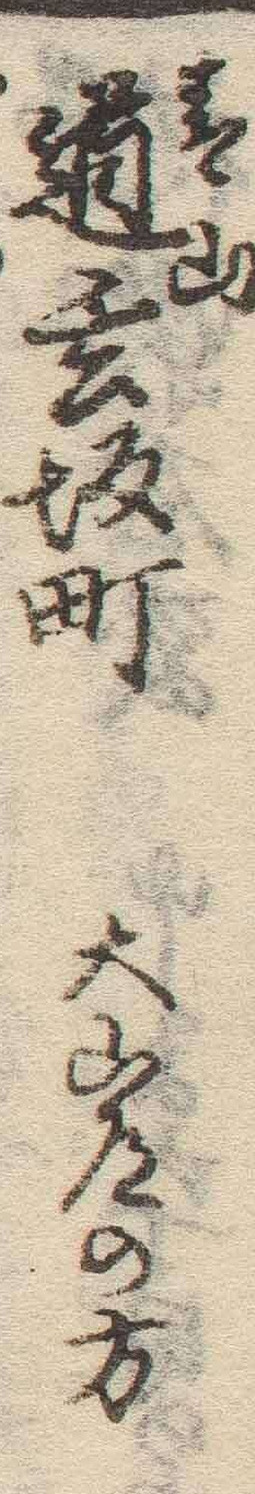道玄坂町大山道の方
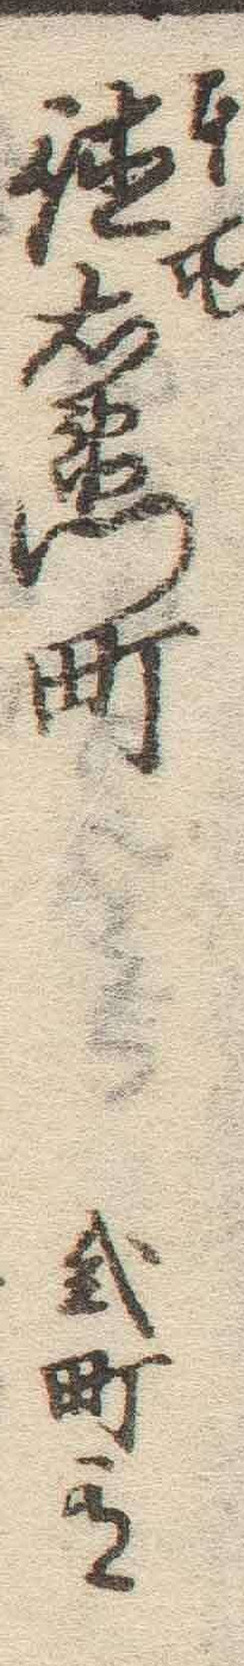徳右衛門町弐町有
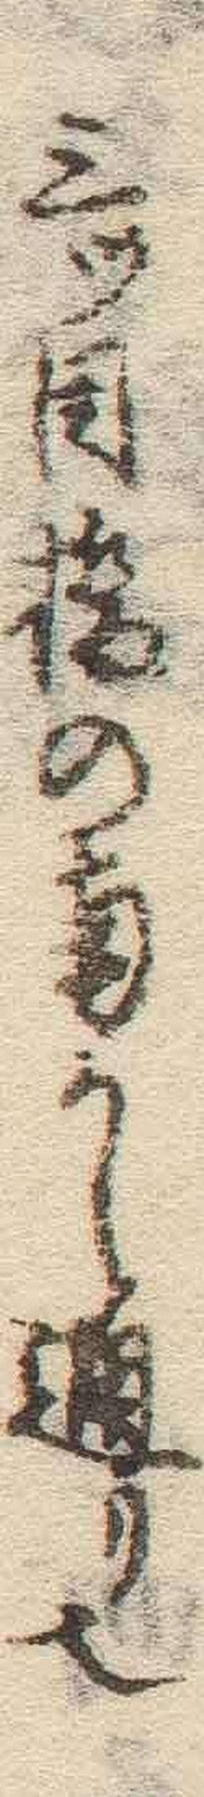三ッ目橋の南かし通り也
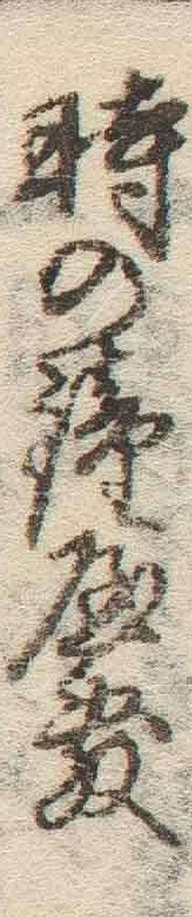時の鐘屋敷
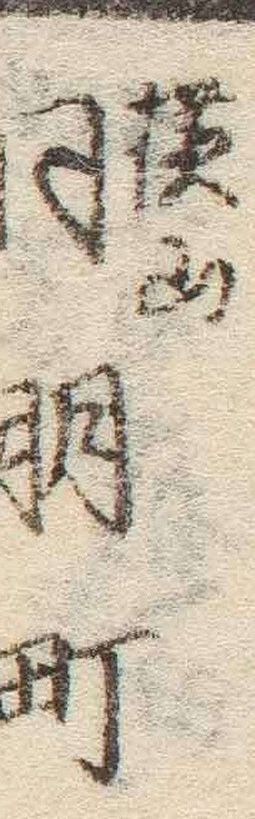同朋町
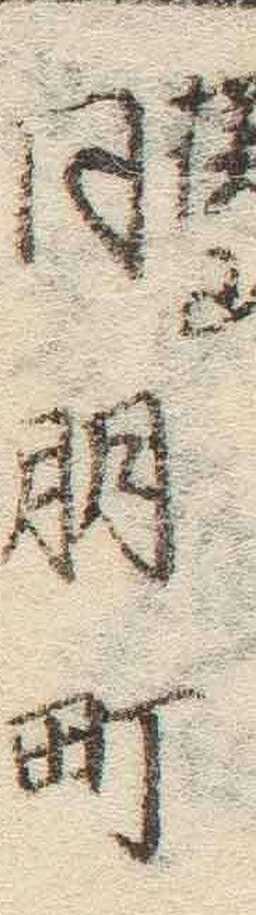同朋町
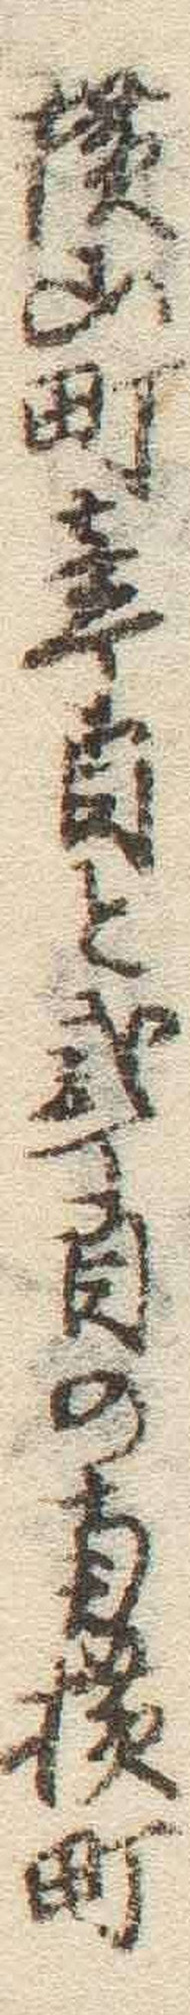横山町壱丁目と弐丁目の南横町
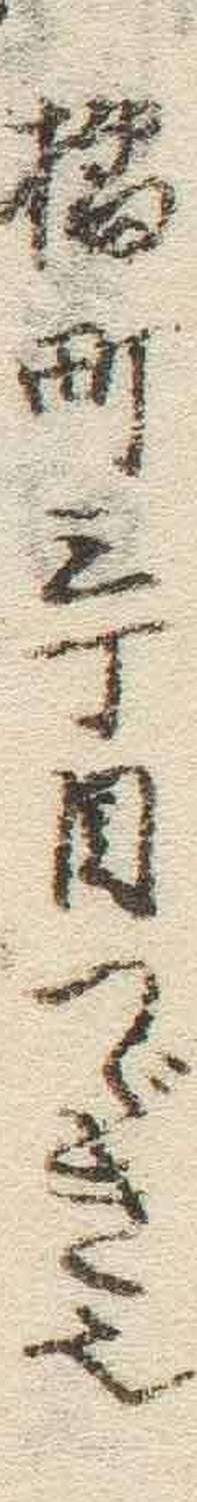橘町三丁目つゞき也
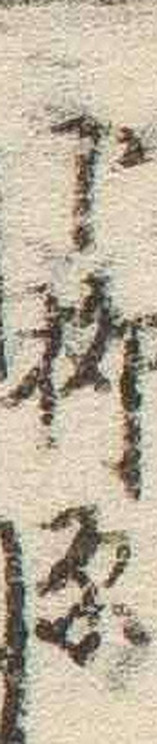下柳原
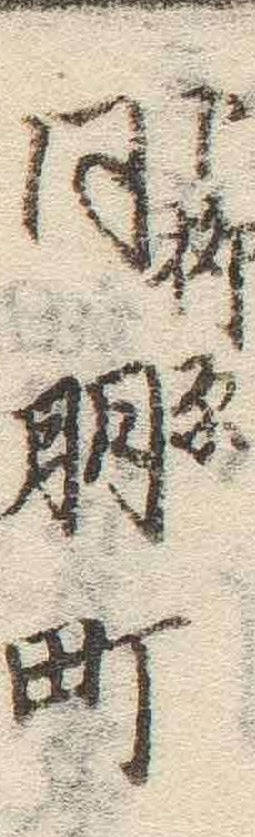同朋町
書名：江戸町独案内
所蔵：東京学芸大学附属図書館 国文学研究資料館
